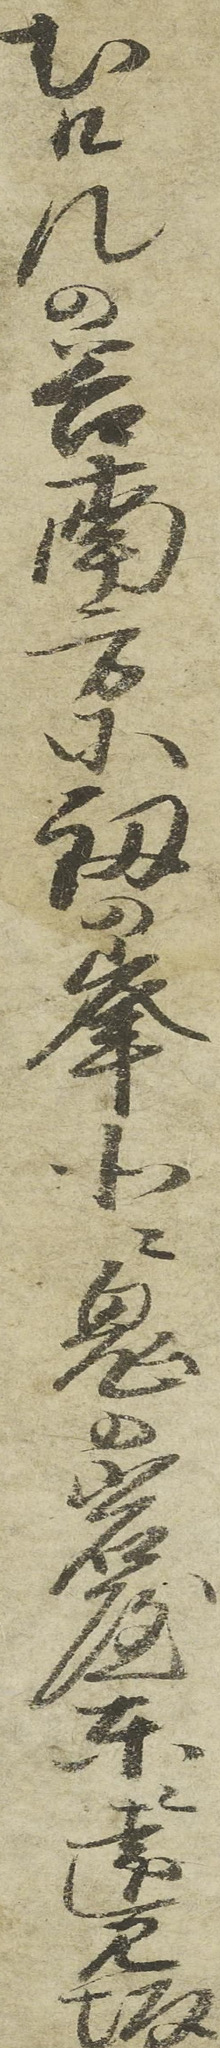むけんの谷南方に剣の峯北に鬼の岩屋東に遠見坂
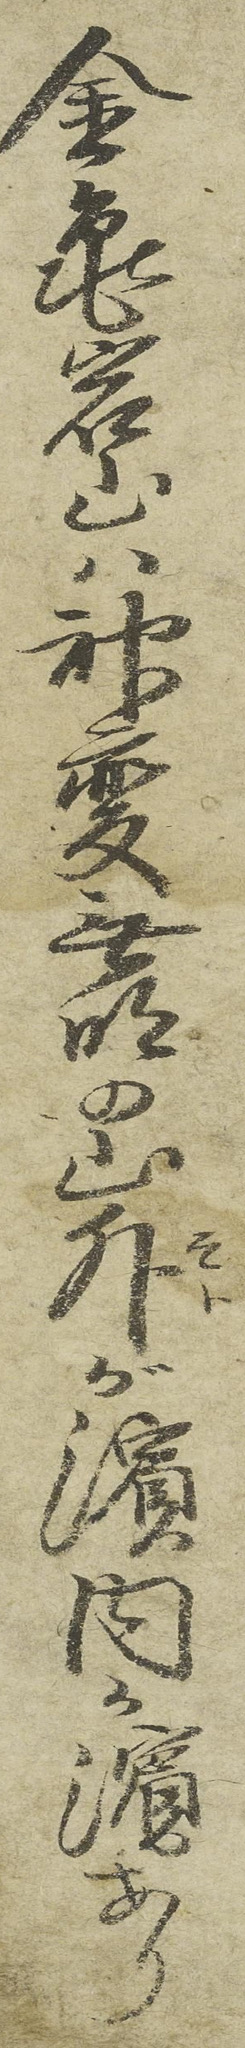金亀岩山は神変無明の山外が浜内か浜あり
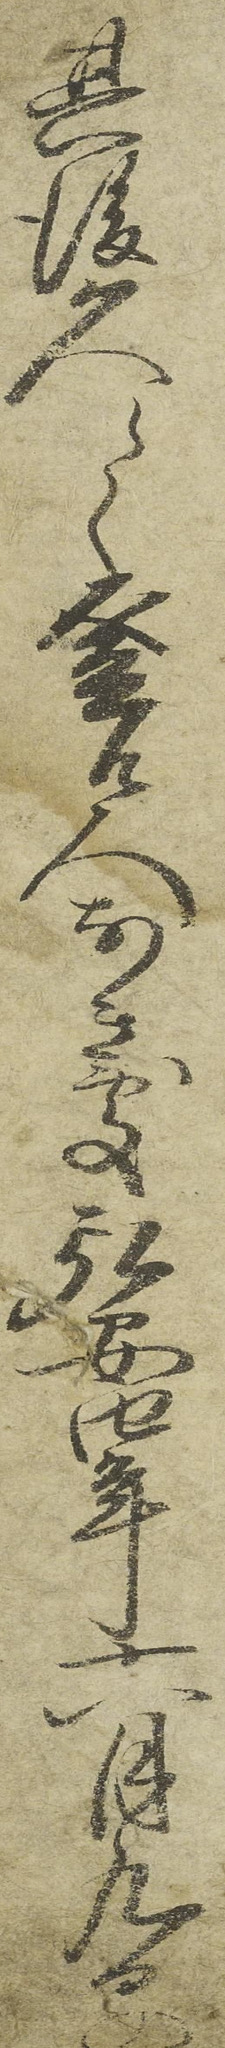其後久しく登ル人なき処弘安四年六月九日の

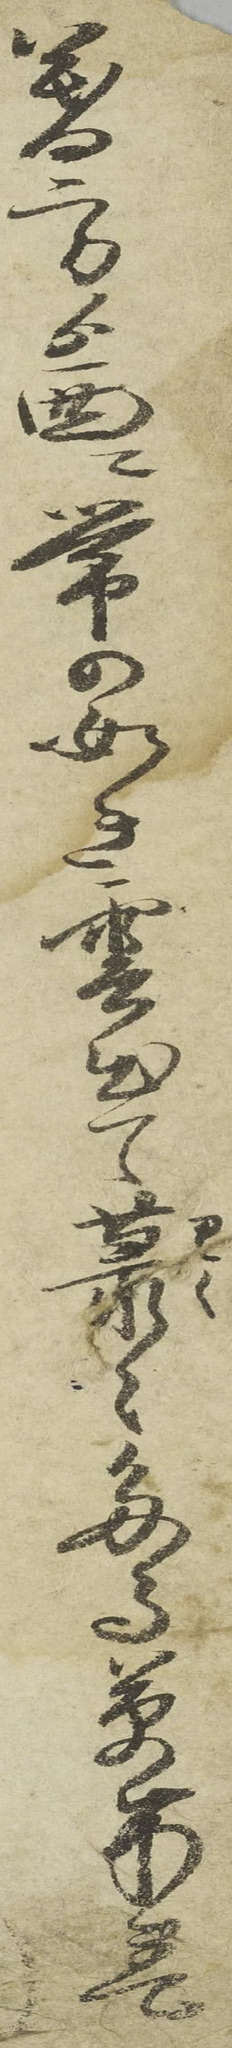暮方ゟ西ニ常の如き雲出て暮々たる草木にて
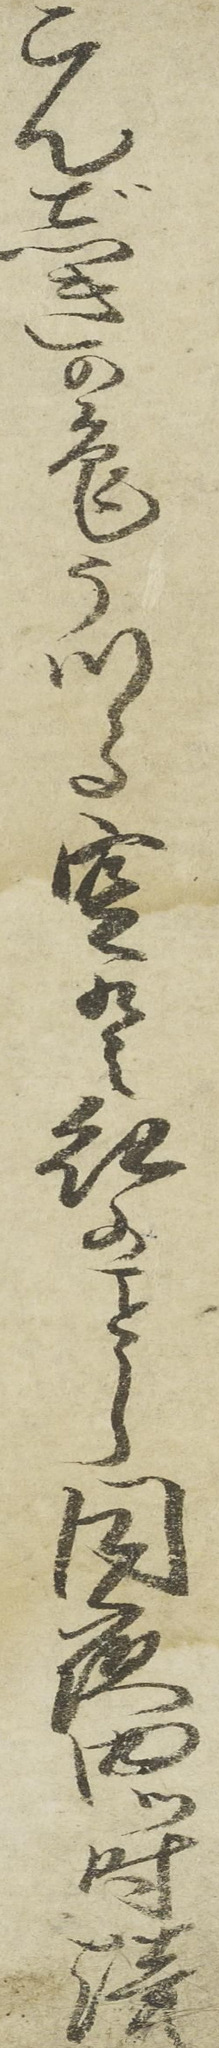こんじきの色うつる空有紅のことし同夜四ツ時燃
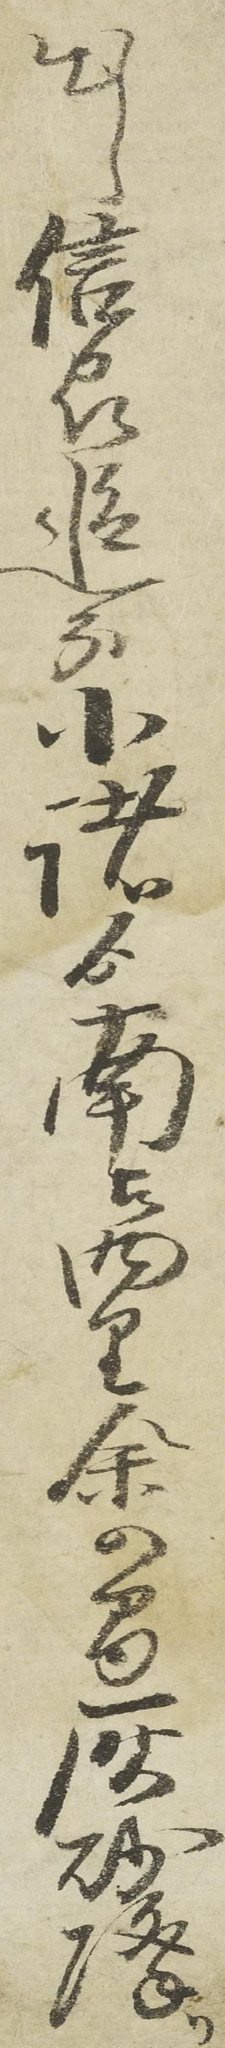出し信州追分小諸ゟ南え四里余の間灰砂降り
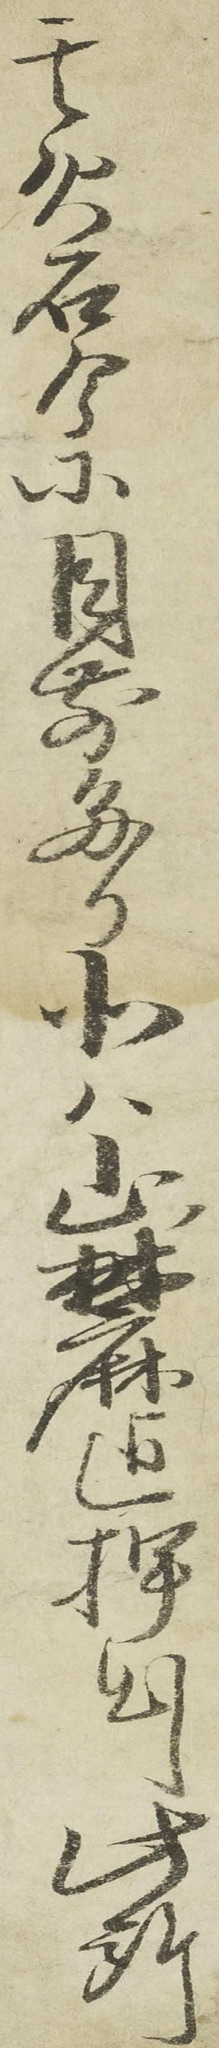其火石今に目前たり北ハ山麓迄押出此所
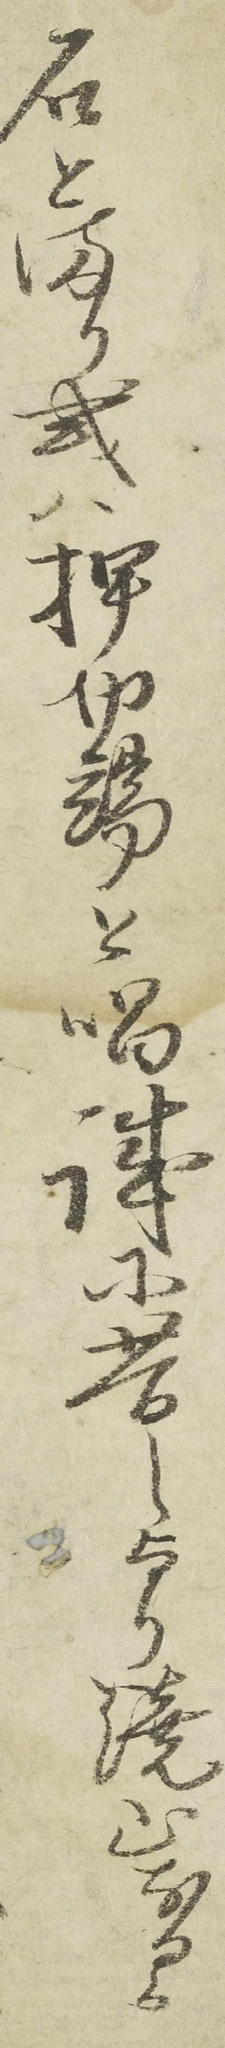石と溜り或ハ押切端と唱誠に昔しより焼山なから
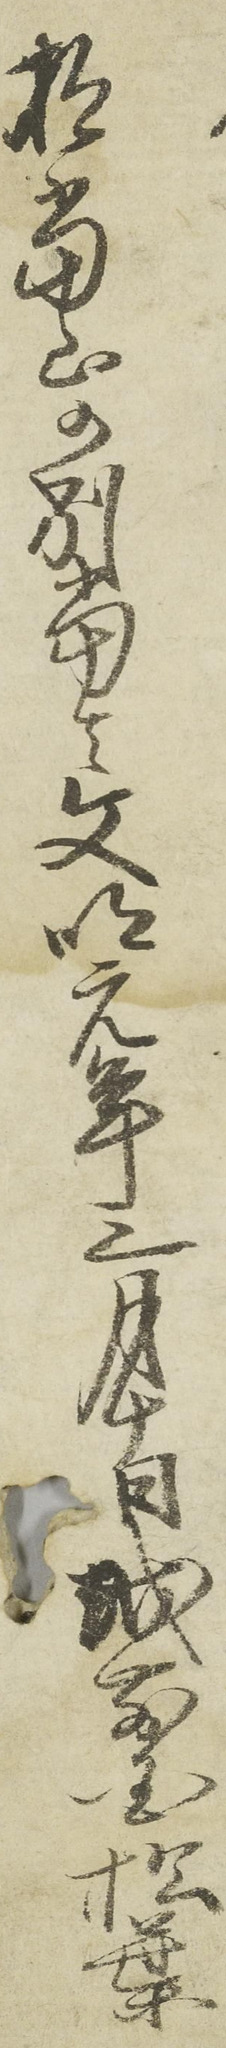松当山の別当は文明元年三月十日越前国松葉
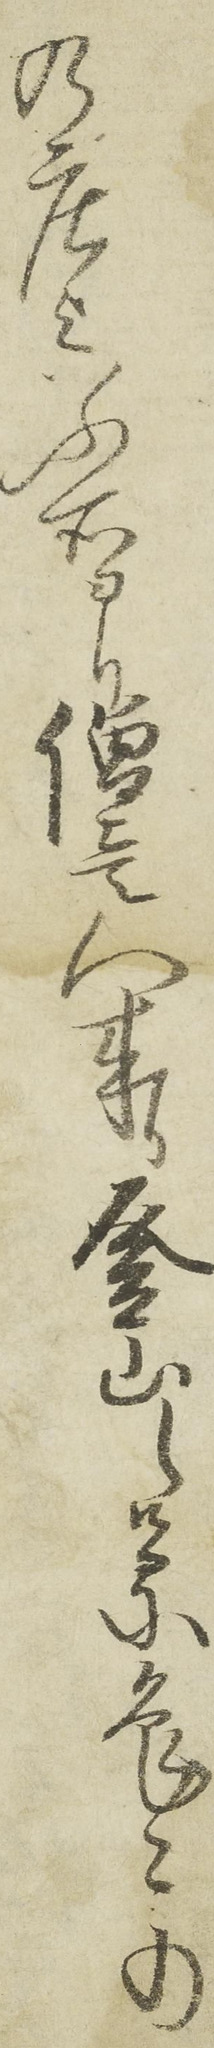の庄といふ所より僧壱人来り登山しけるに色々の
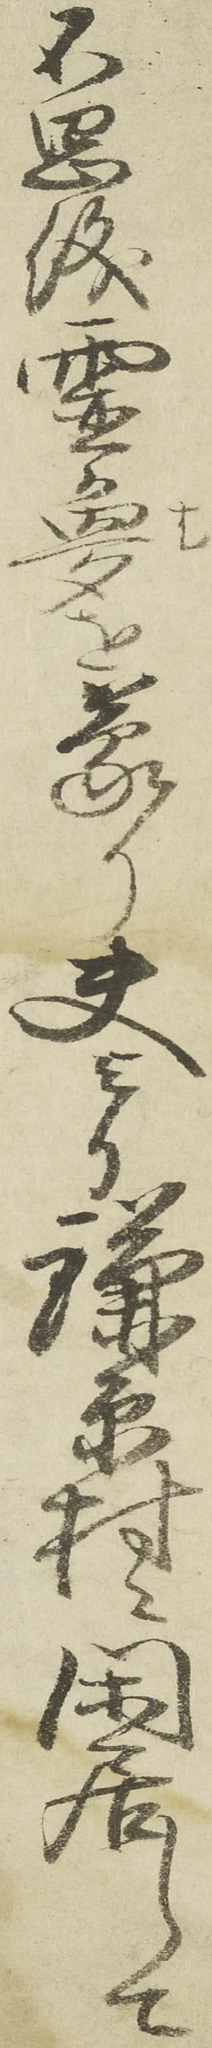不思議霊夢を蒙り夫より鎌原村ニ閑居して
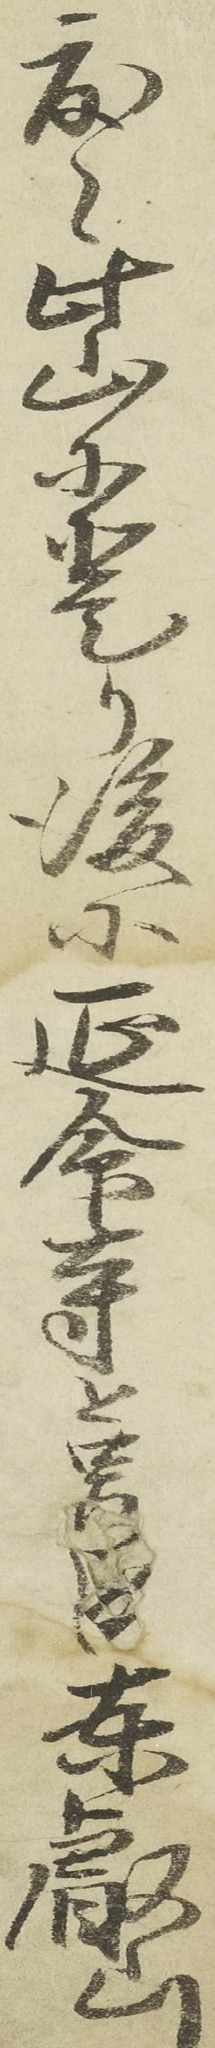度々此山に登り後に延命寺と号し東叡山
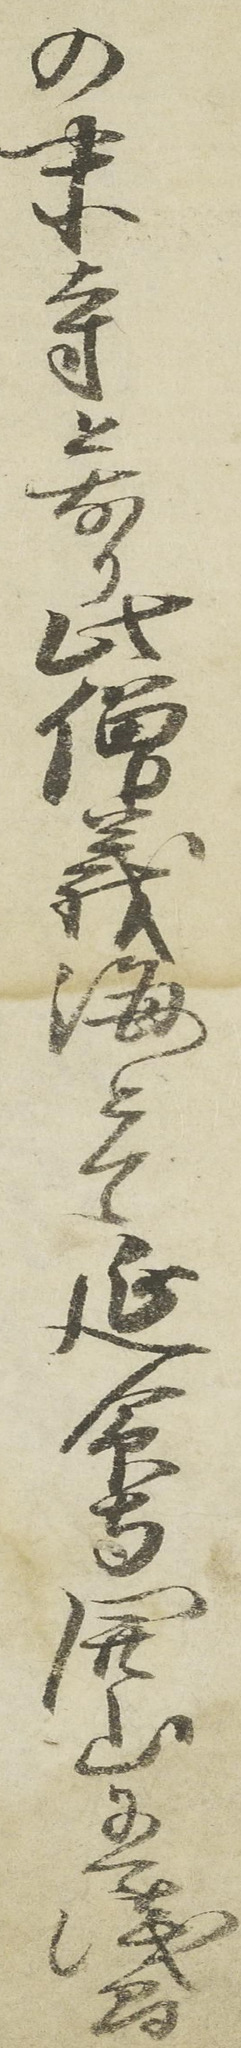の末寺となり此僧義海ニて延命寺開山有浅間
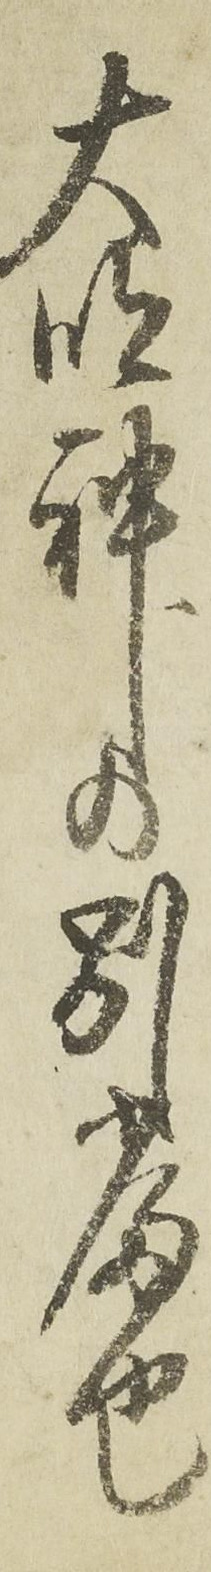大明神の別当也
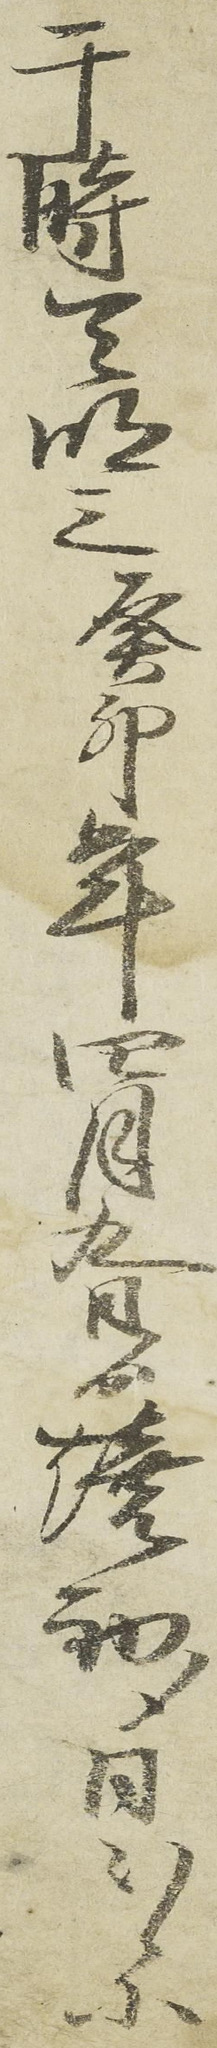干時天明三癸卯年四月九日ゟ焼初メ日々に
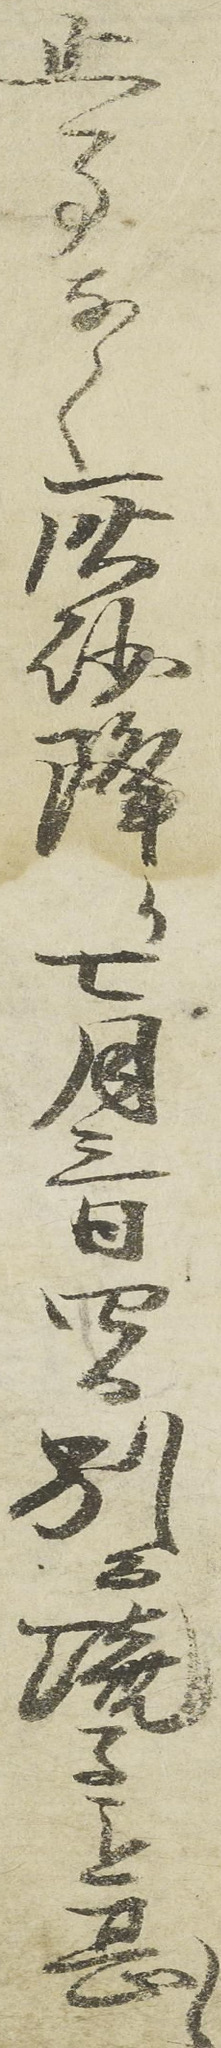止事なく灰砂降り七月三日四日別而焼ること甚し
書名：浅間大変略記
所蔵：東京大学地震研究所図書室 Earthquake Research Institute Library, The University of Tokyo, JAPAN
